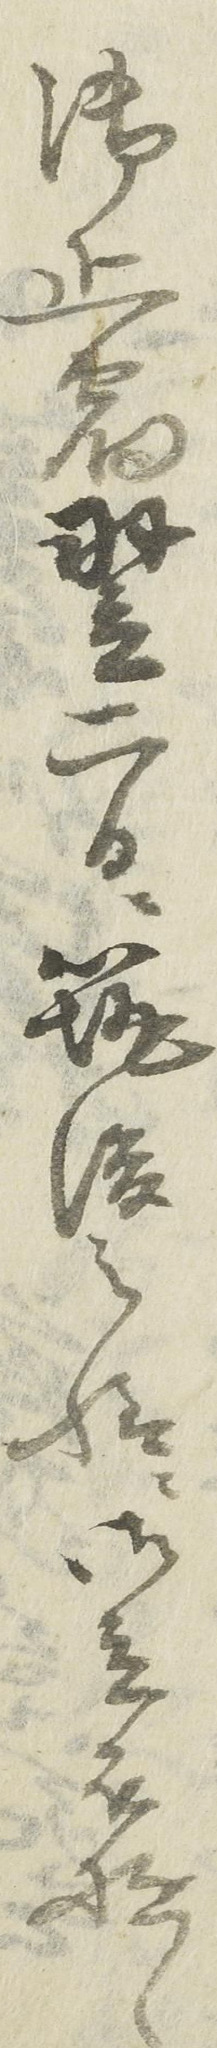御止宿翌二日ニ筑後之様二御立被遊候
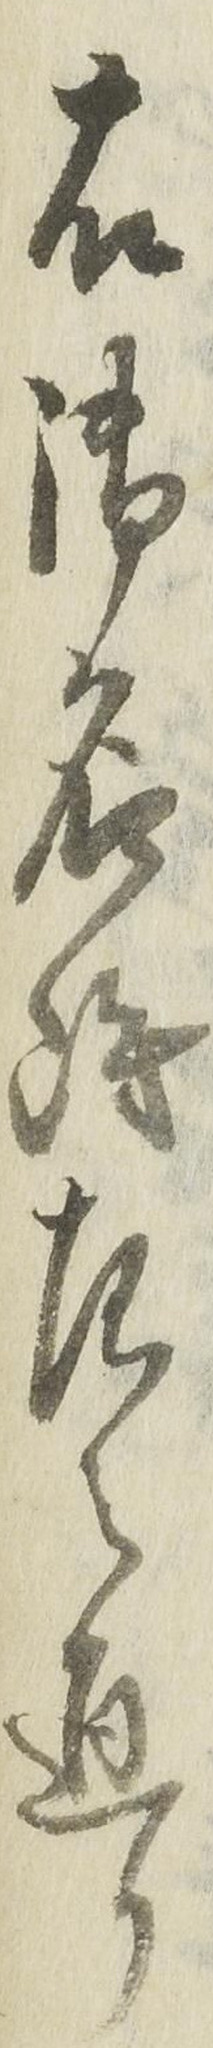右御名称左之通り

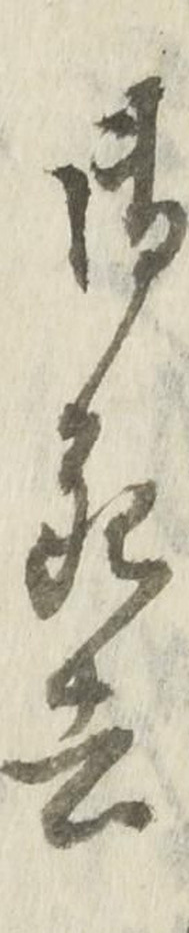御死去
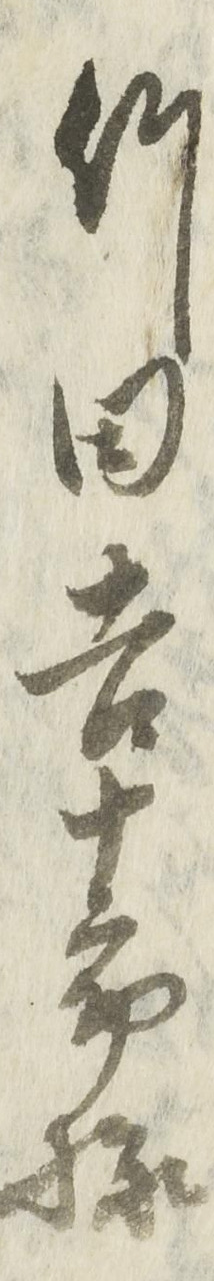竹田吉十郎様
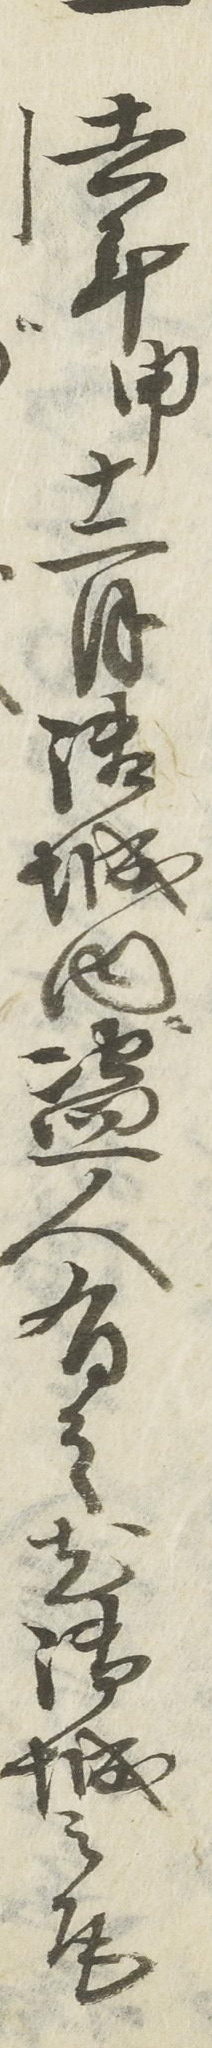一去年申十二月御城内ニ盗人有之尤御城之瓦
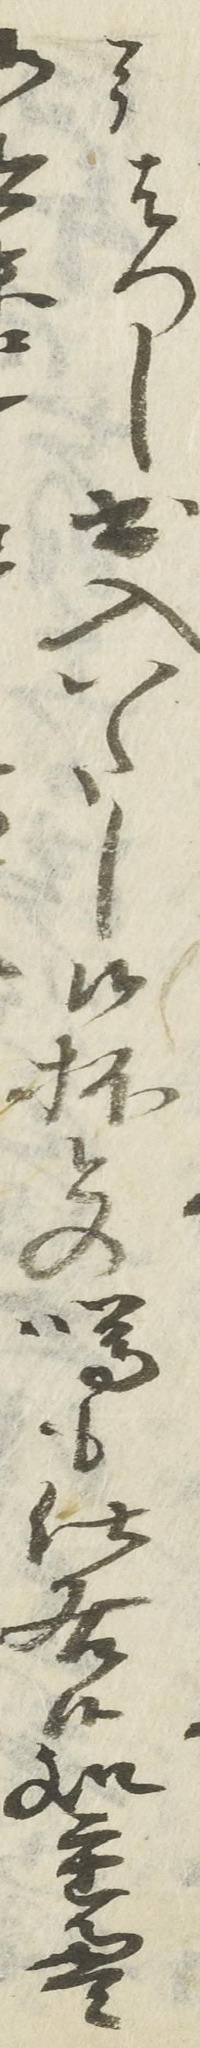引はづし出入いたし候抔との噂も仕居候処重畳
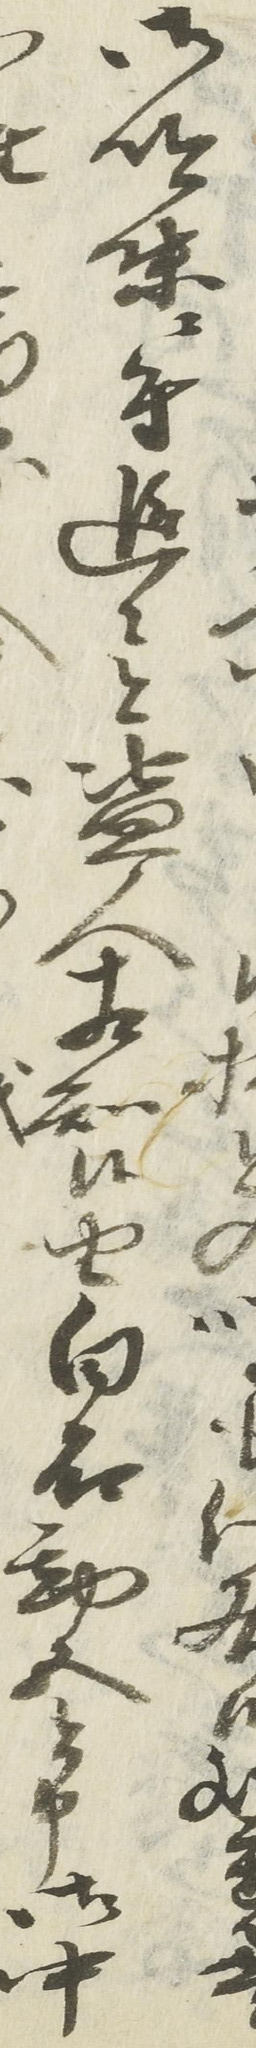御吟味ニ付追〻と盗人相知候由白石勘五と申御中
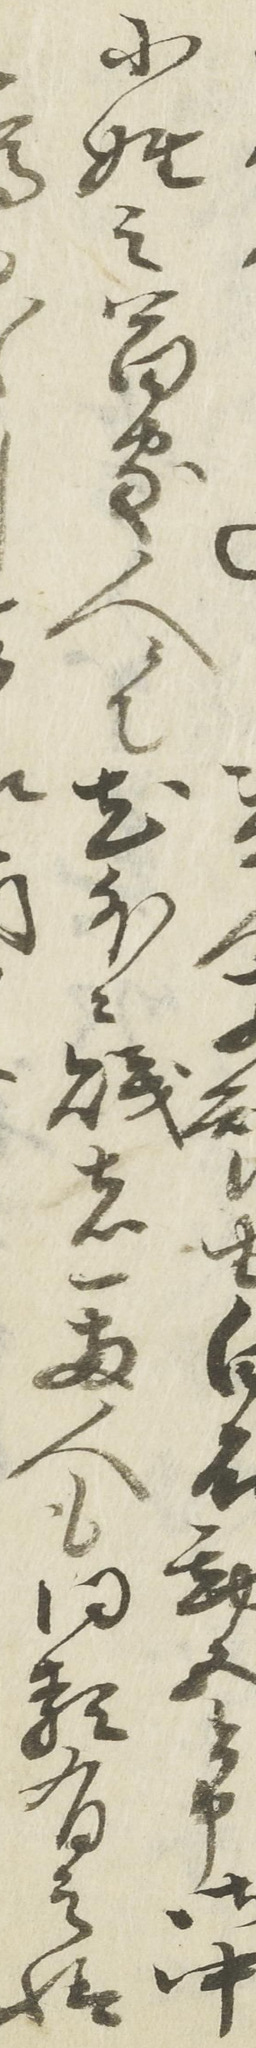小姓之富家人ニて尤外ニ賊は一両人も同類有之様
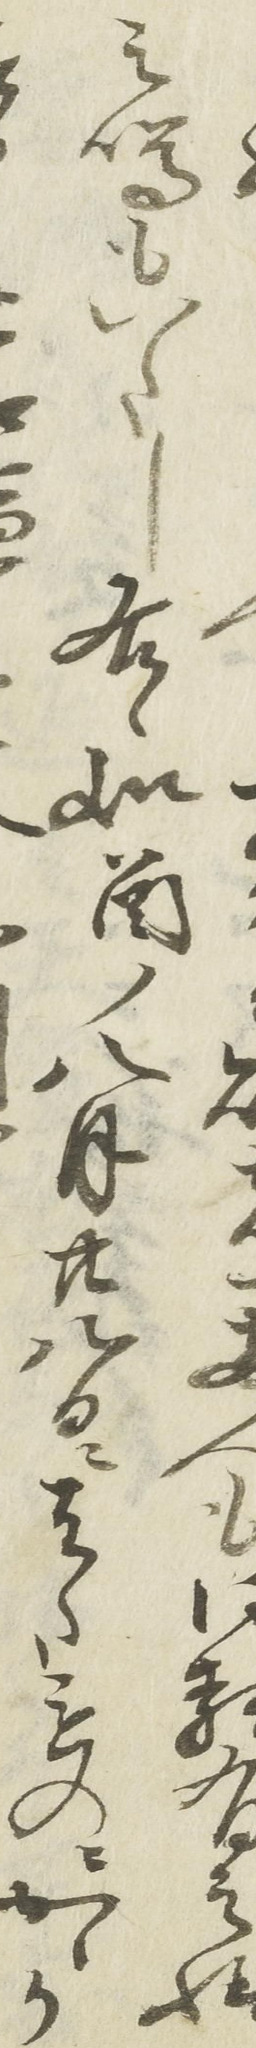之噂もいたし居候処酉ノ八月廿八日ニはたものニ加り
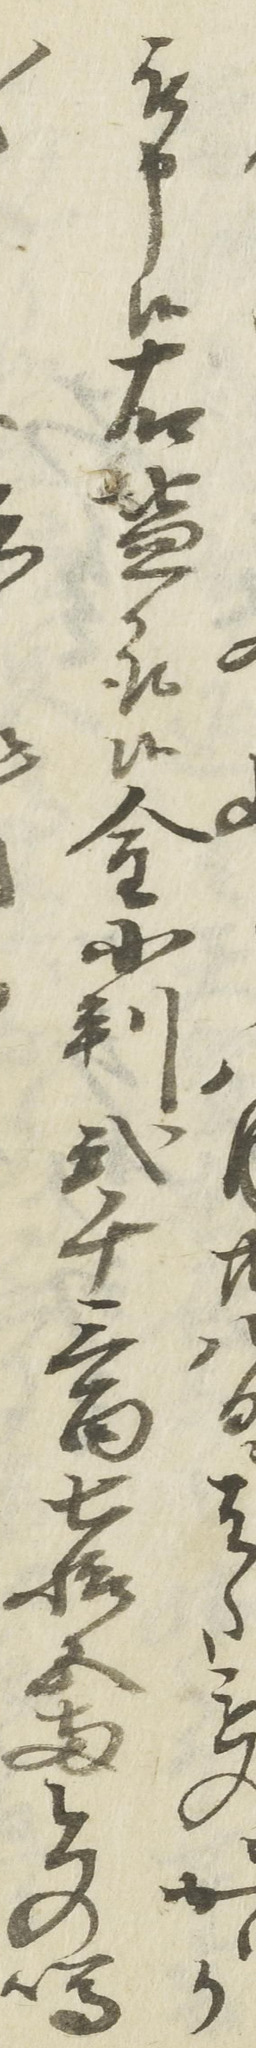被申候右盗取候金小判弐千三百七拾五両との噂
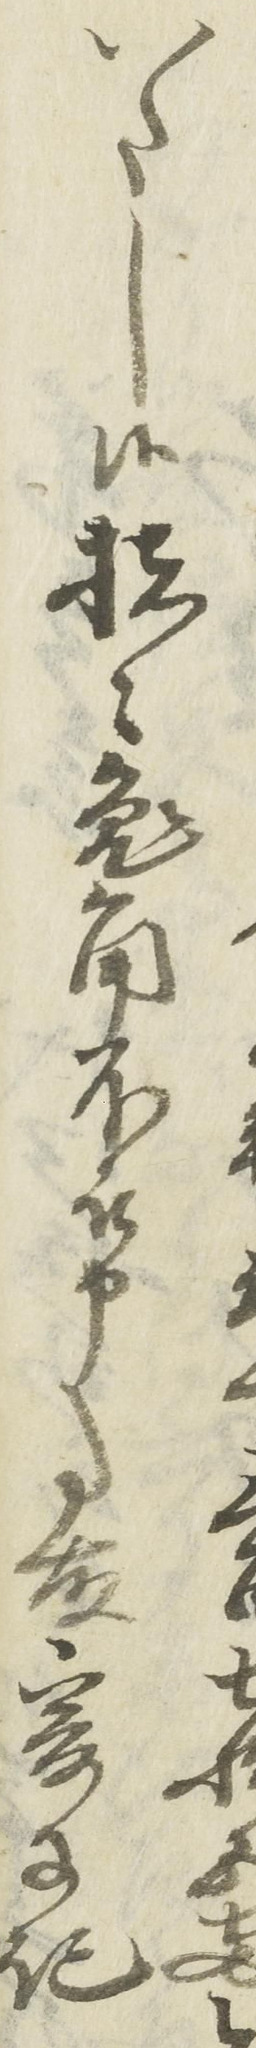いたし候偖〻兎角不被申事故爰に記
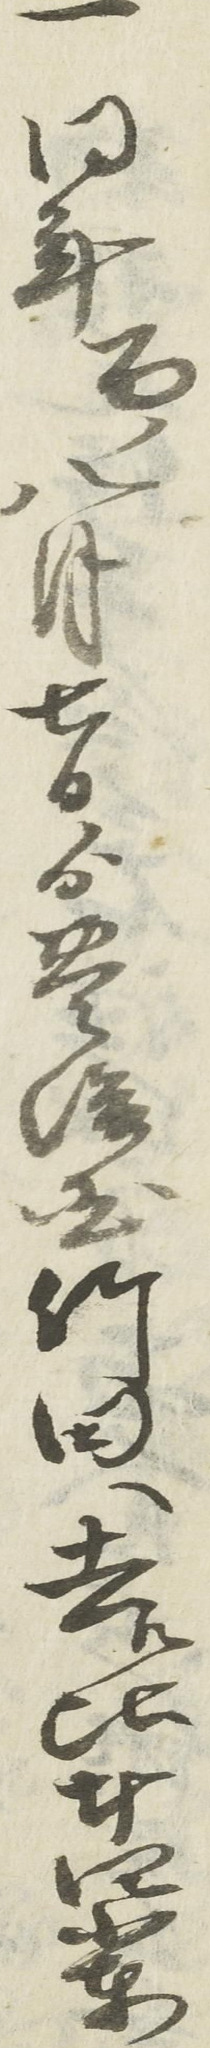一同年酉ノ八月七日ゟ豊後国竹田ヘ去ル比廿四輩
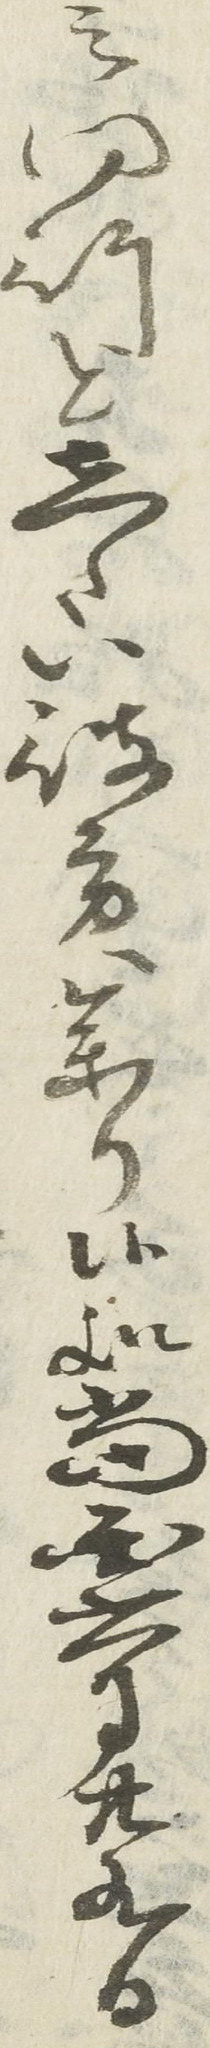之同行をしたい彼方ヘ参り候処当国六月廿九日
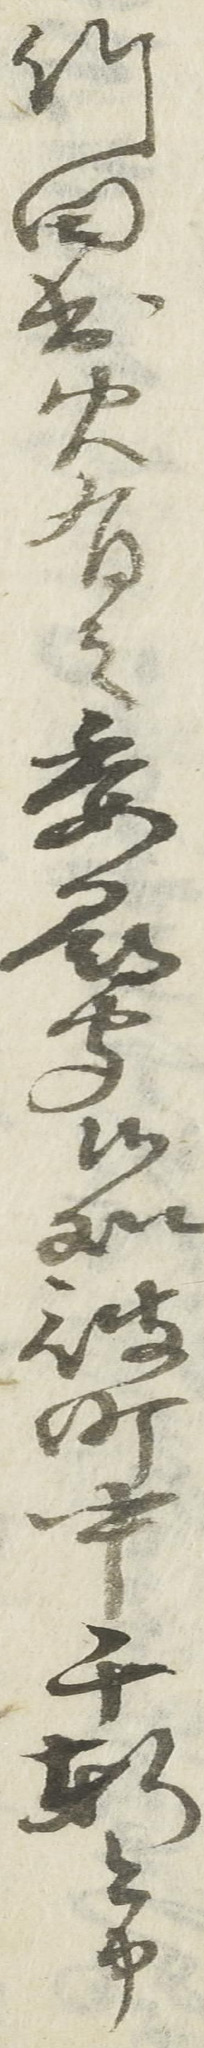竹田出火有之委尋聞候処彼町中千軒と申
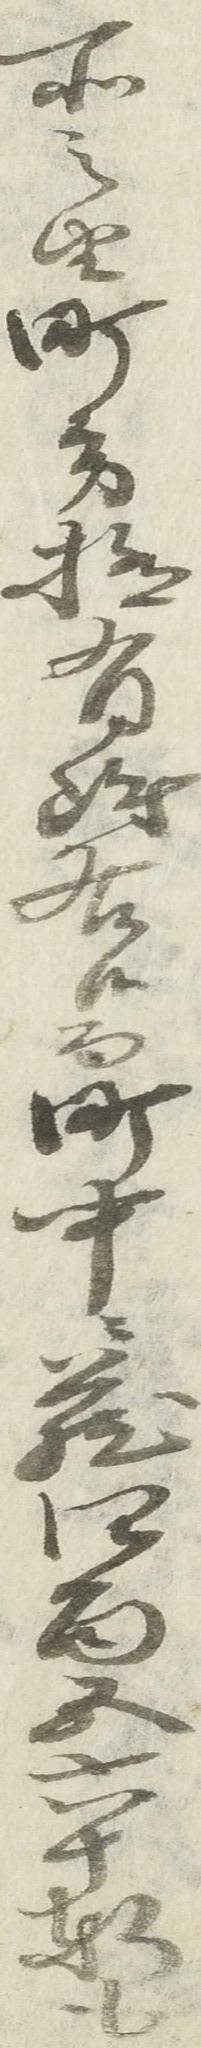所之由町方極有附居候而町中ニ蔵四百五六十軒も
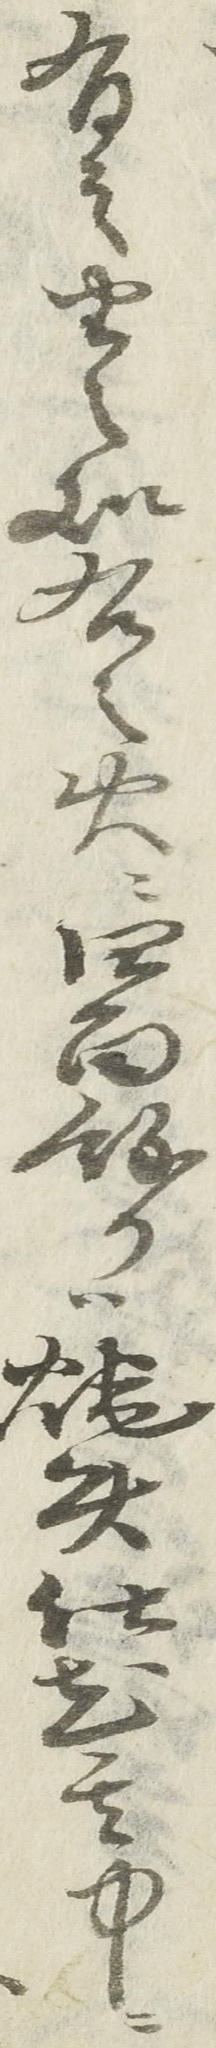有之由候処右之火ニ四百余りは焼失仕尤其中ニ
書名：後見笑
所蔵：東京大学地震研究所図書室 Earthquake Research Institute Library, The University of Tokyo, JAPAN
